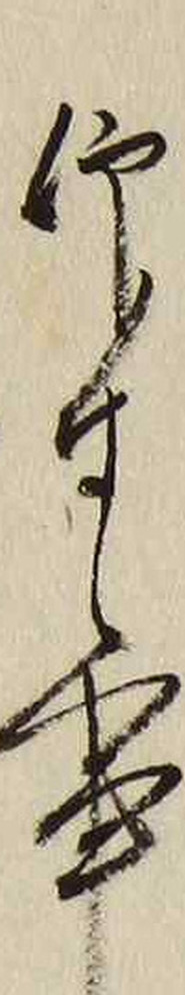仰付候事
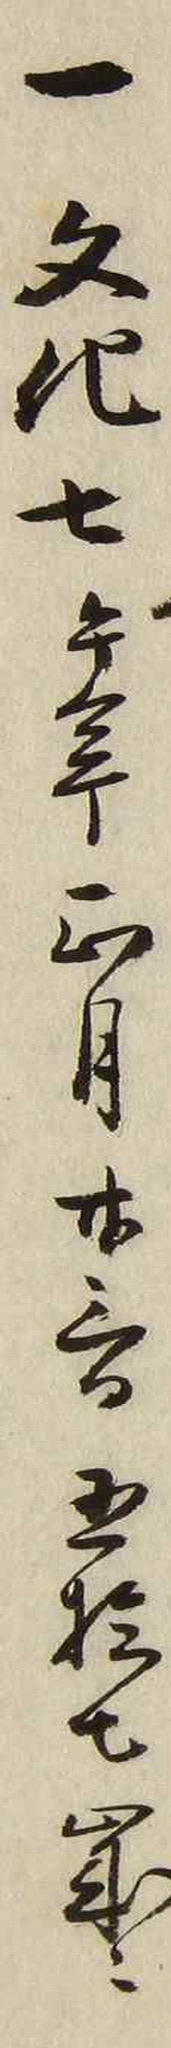一文化七午年正月廿三日五拾七歳ニ

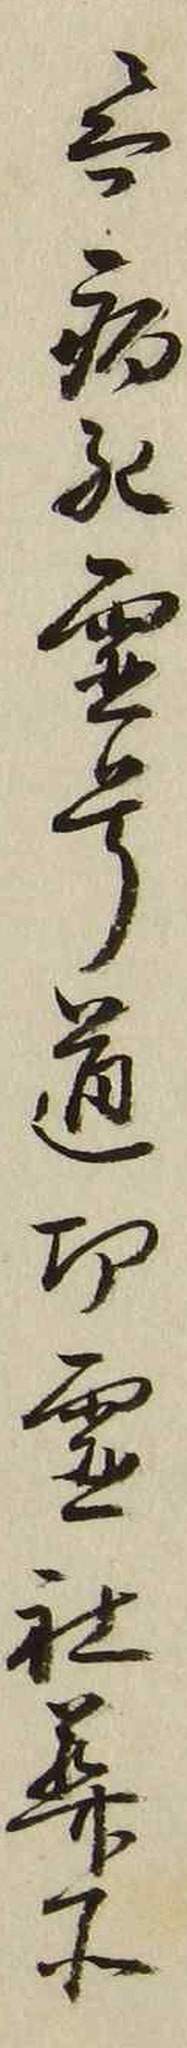ニ而病死霊号道切霊社葬所
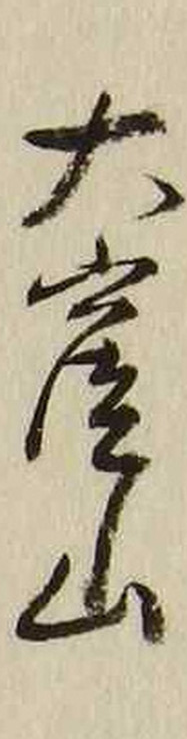大窪山
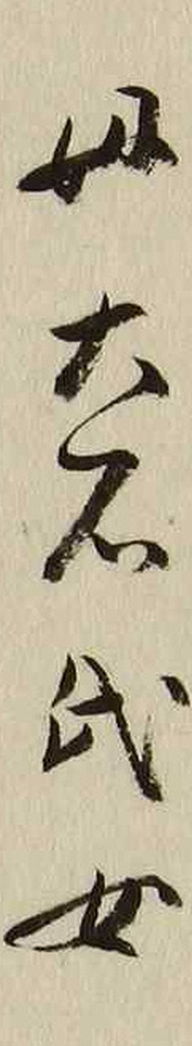母大石氏女
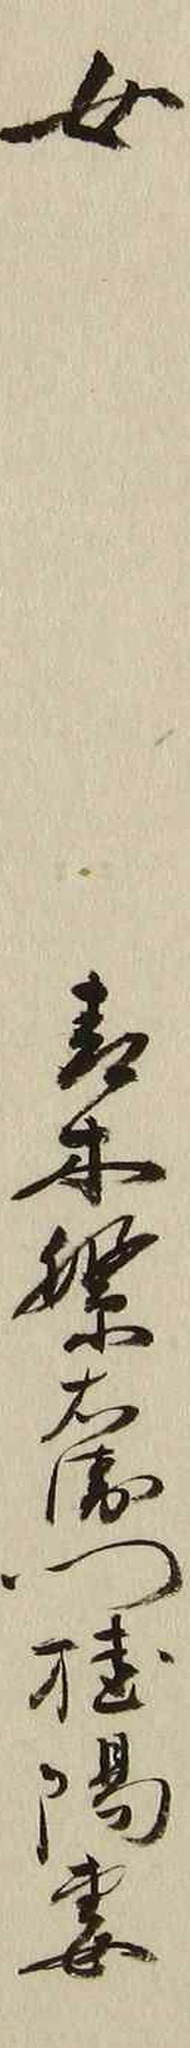女青木繁右衛門桂陽妻
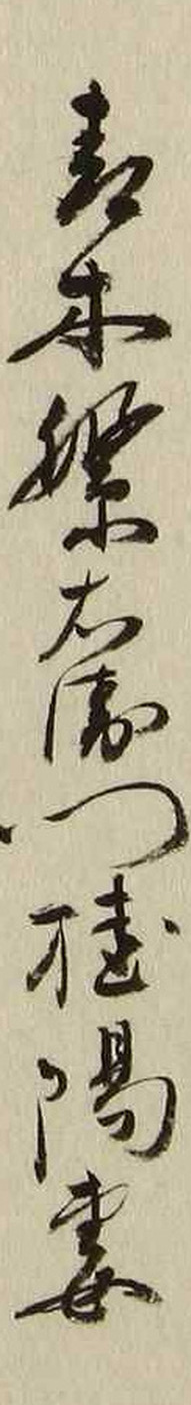女青木繁右衛門桂陽妻
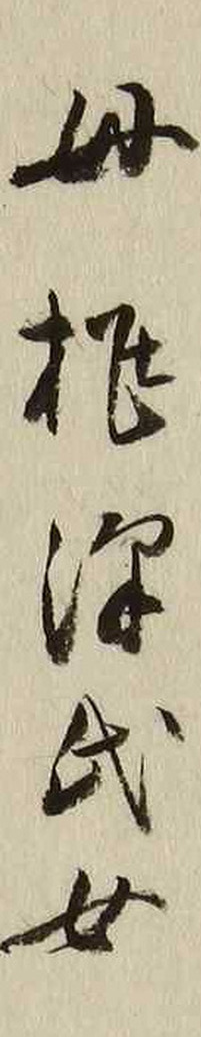母桃沢氏女
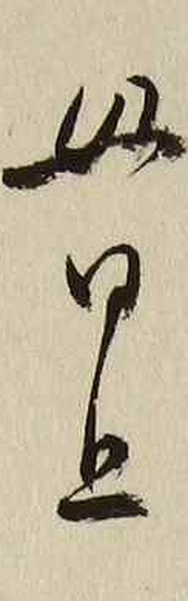女同上
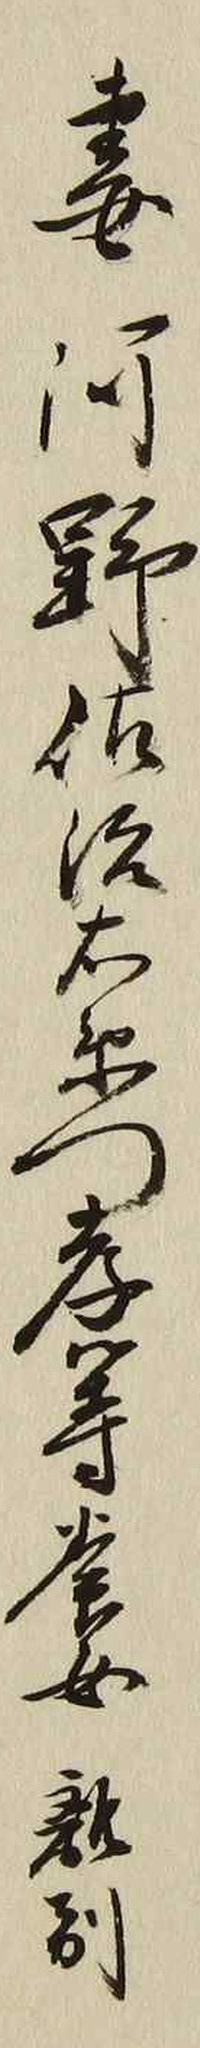妻河野佐治右衛門孝等養女離別
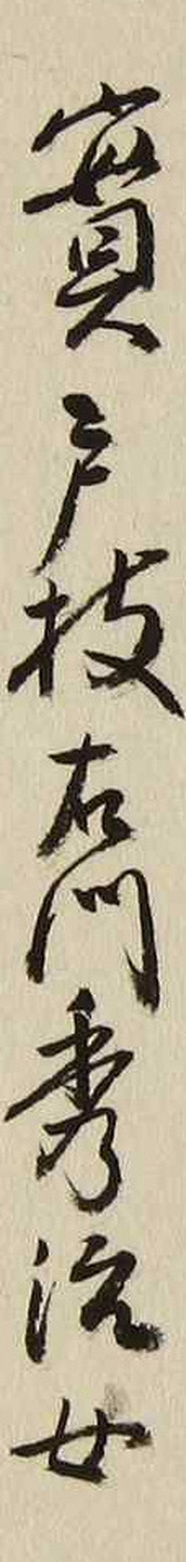実戸枝右門秀治女
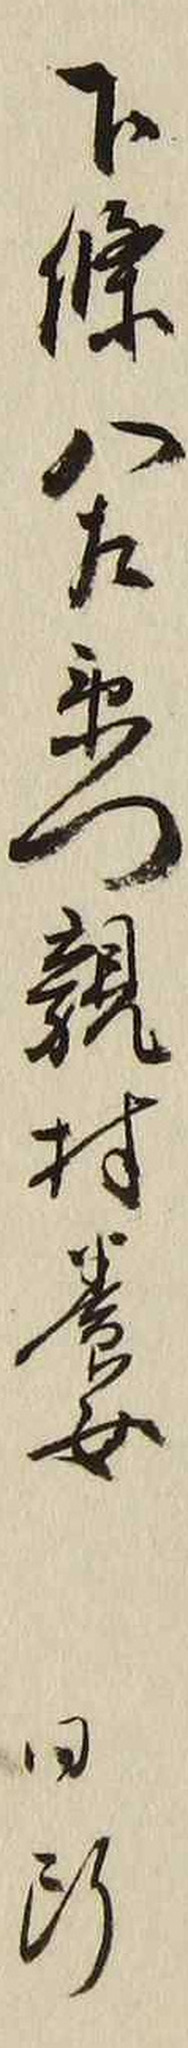下条八左衛門親村養女同断
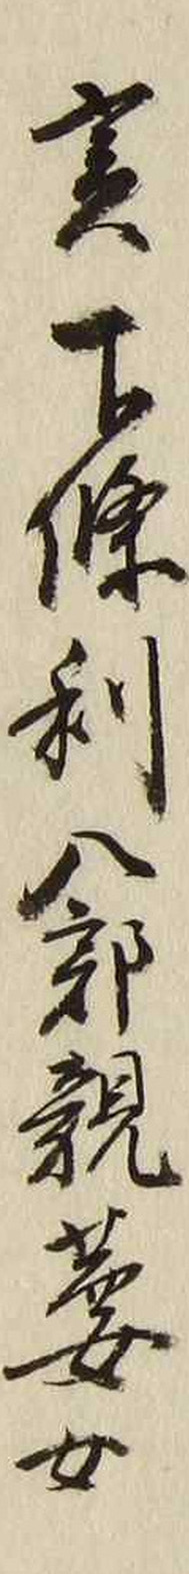実下条利八郎親葽女

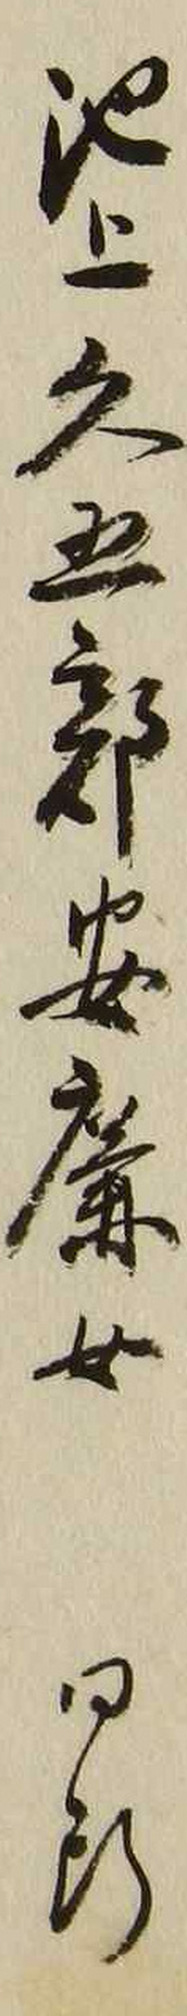池上久五郎安廉女同断
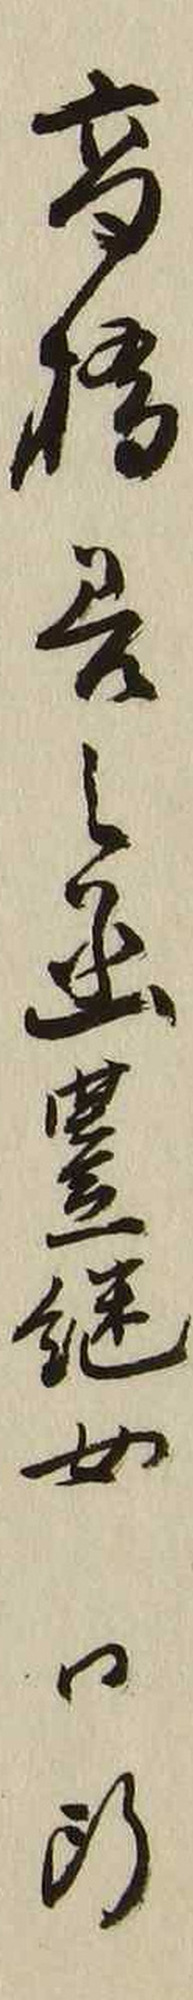高橋善之丞豊継女同断
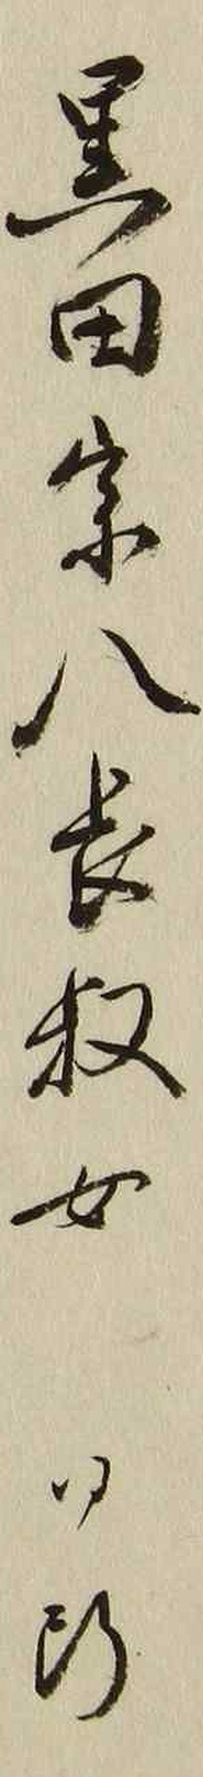黒田宗八長叔女同断
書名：諸士系譜　巻之291　さ之部23
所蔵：会津若松市立会津図書館
